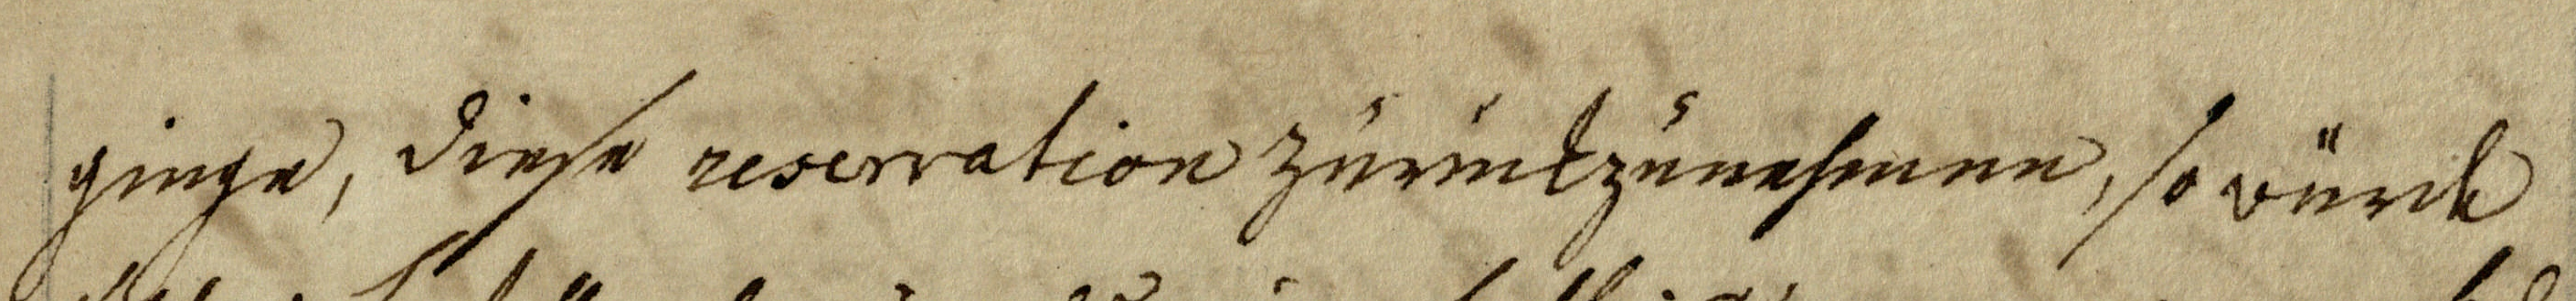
ginge, diese reservation zurückzunehmen, so würde
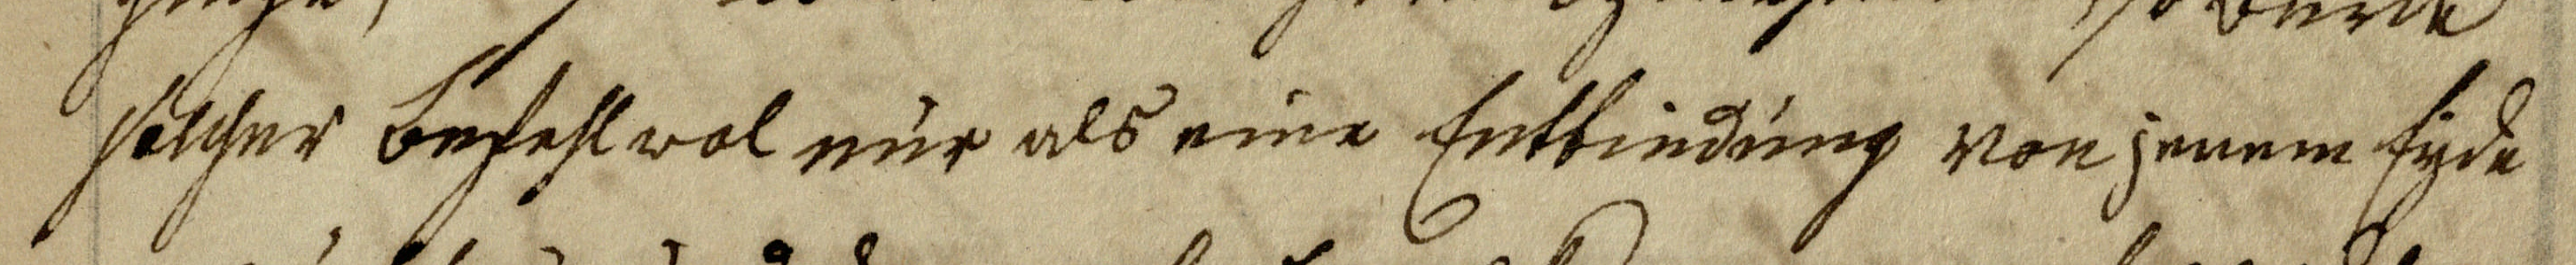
solcher Befehl wohl nur als eine Entbindung von jenem Eÿde
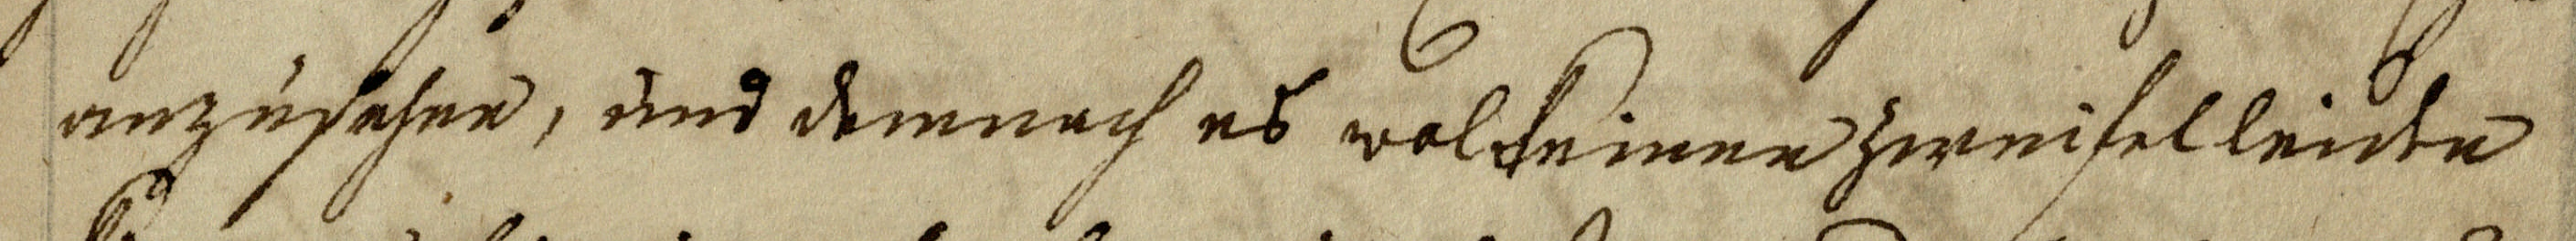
anzusehen, und demnach es wohl keinen Zweifel leiden
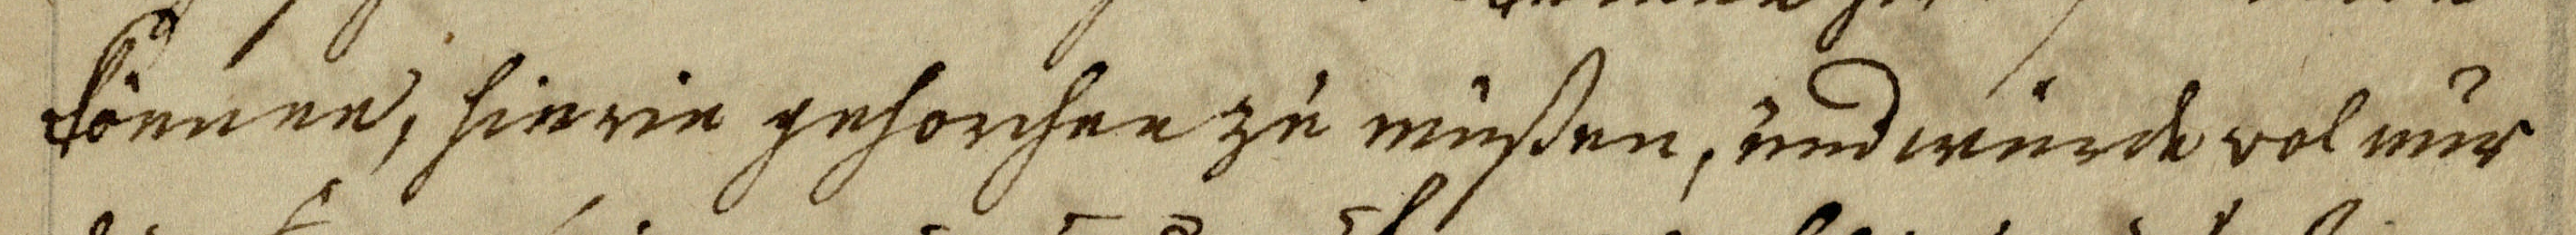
können, hierin gehorchen zu müßen, und würde wol nur
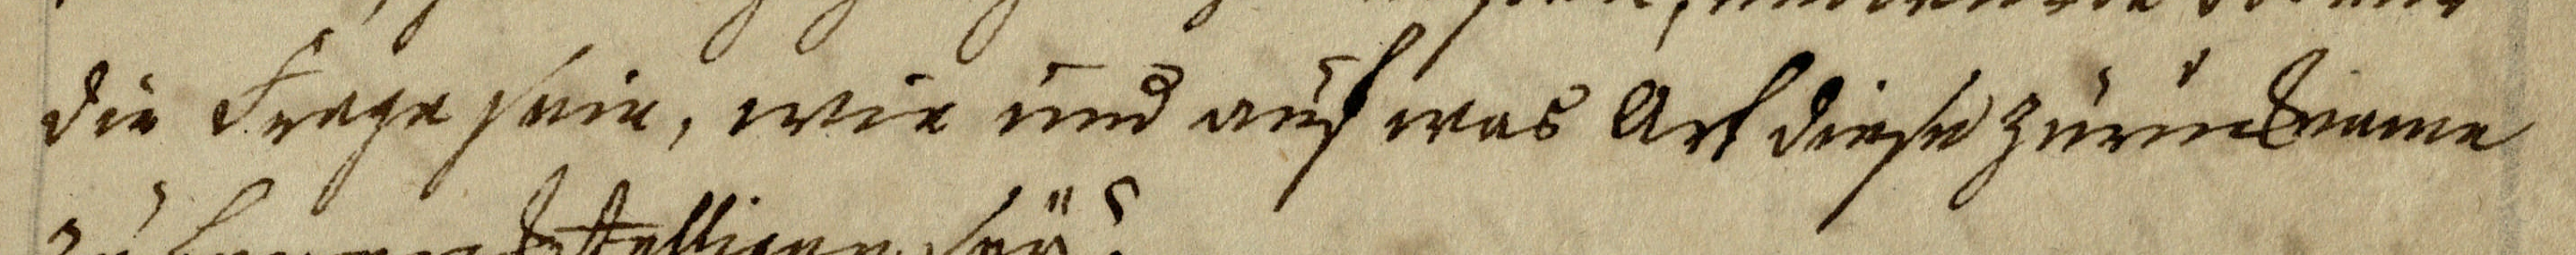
die Frage sein, wie und auf was Art diese Zurückname
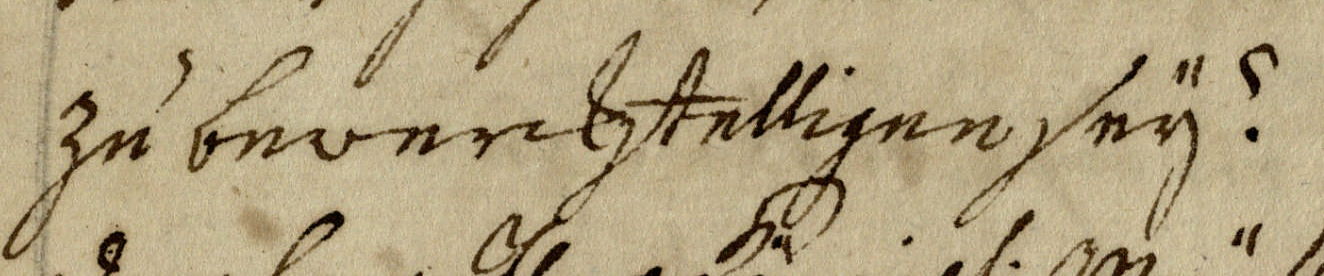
zu bewerkstelligen seÿ.
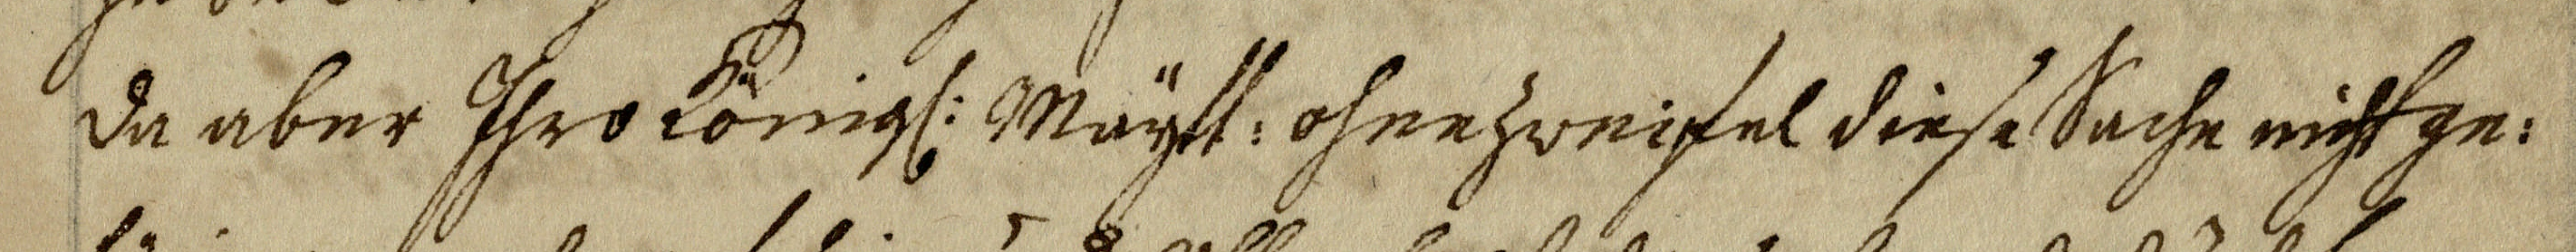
Da aber Ihro Königl. Maÿtt. ohne Zweifel diese Sache nicht ge¬
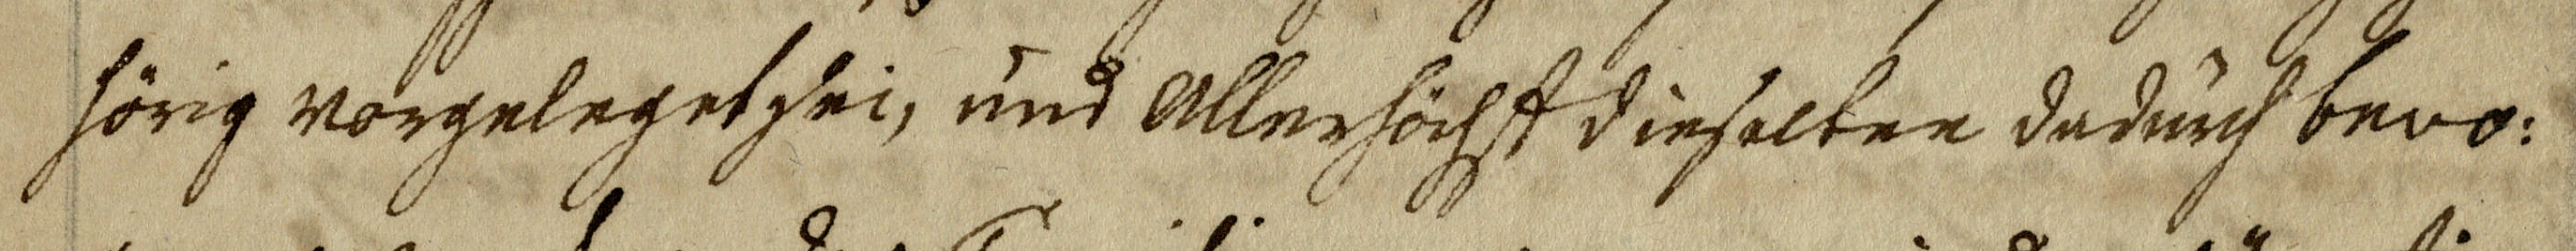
hörig vorgeleget sei, und Allerhöchst dieselben dadurch bewo¬
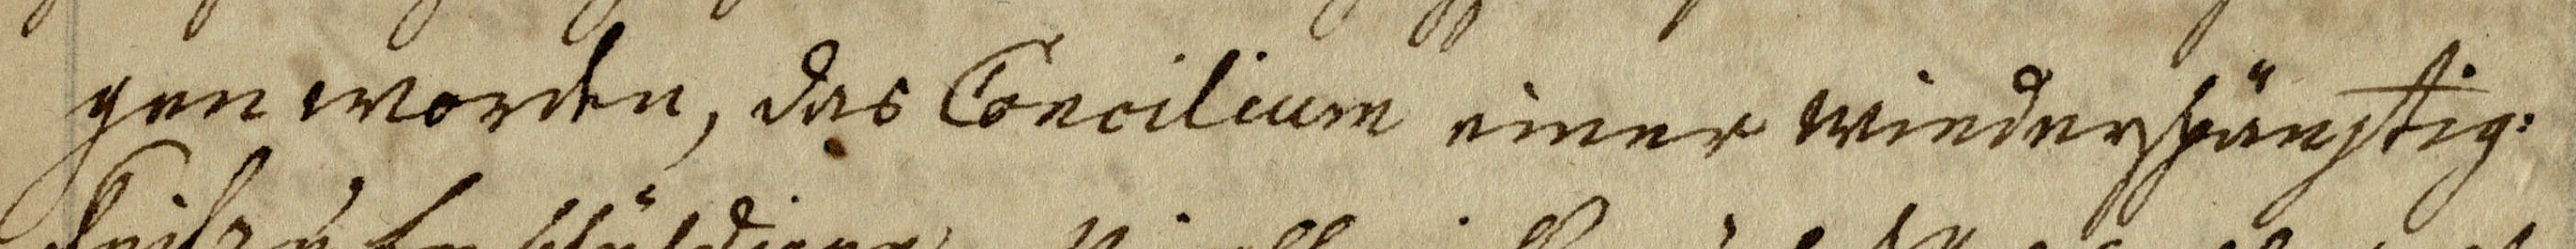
gen worden, das Concilium einer Wiederspänstig¬
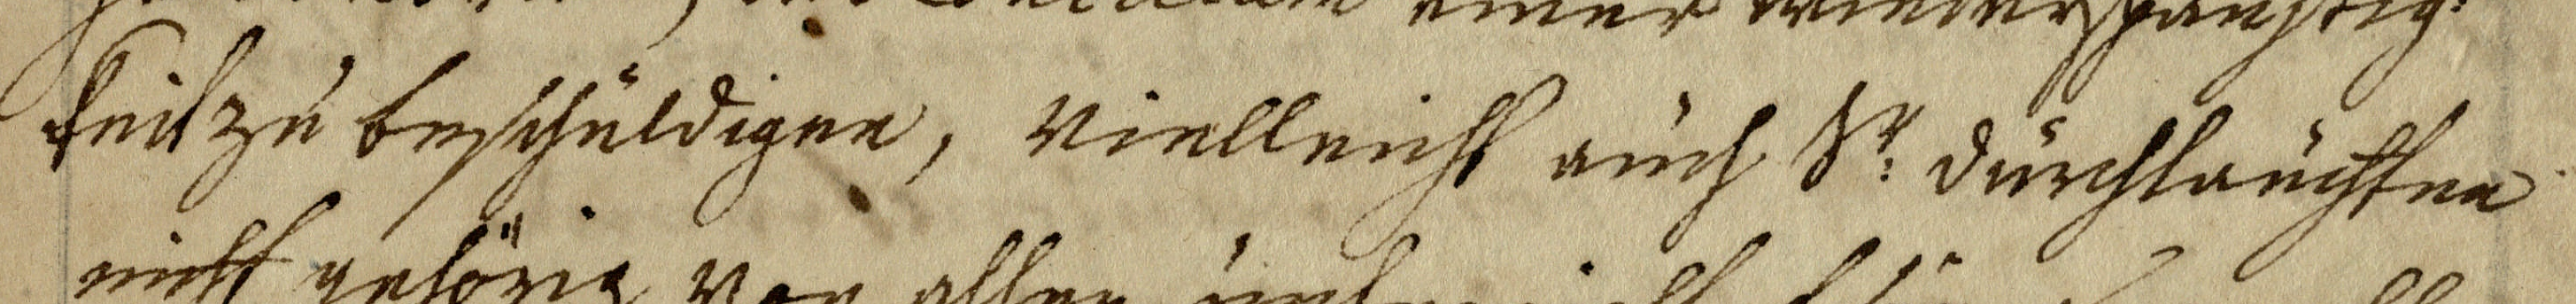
keit zu beschuldigen, vielleicht auch Sr. Durchlauchten
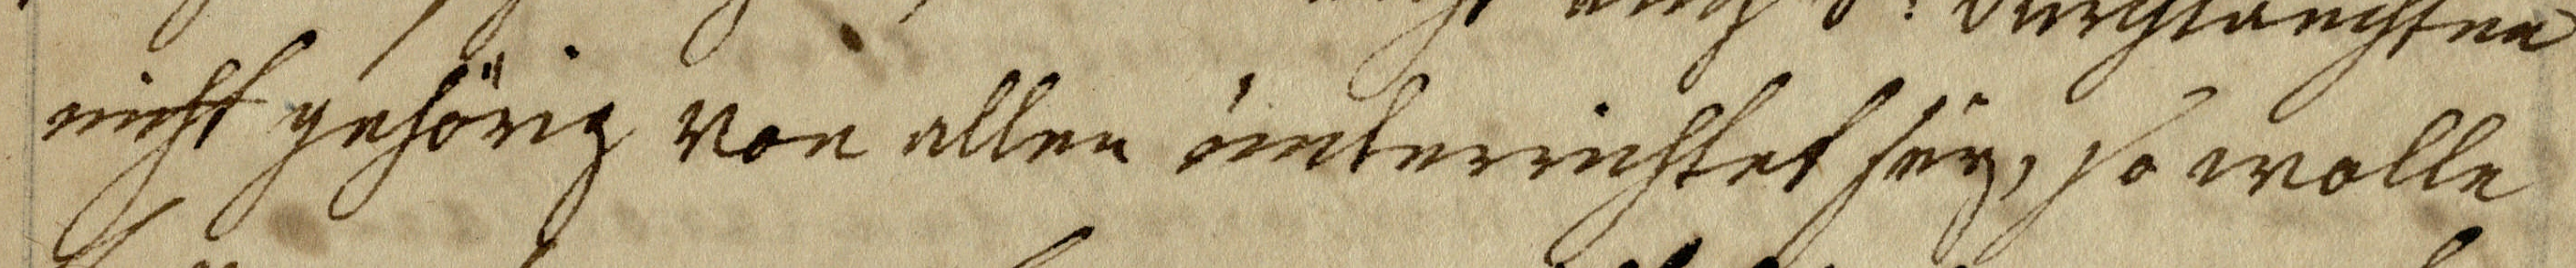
nicht gehörig von allen unterrichtet seÿ, so wolle
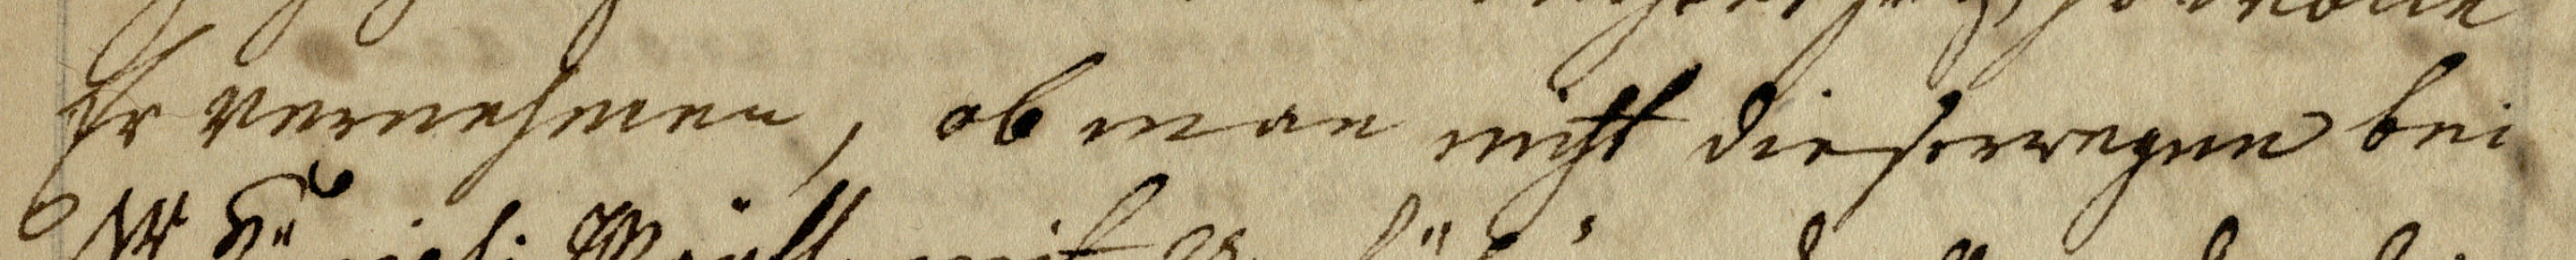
Er vernehmen, ob man nicht dieserwegen bei
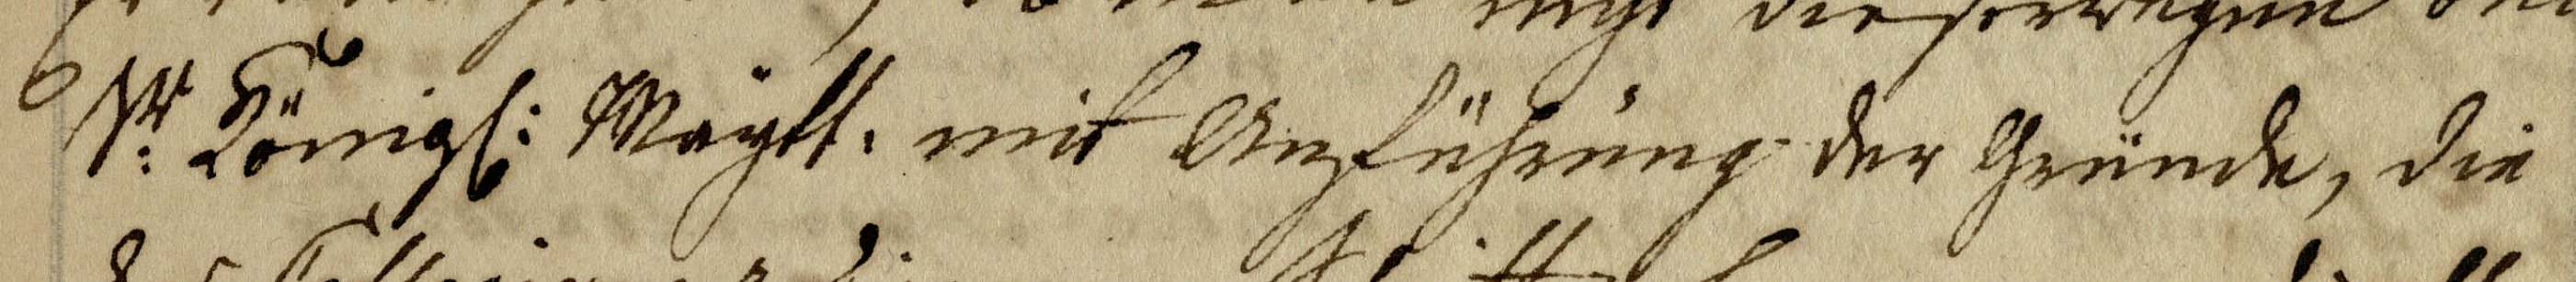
Sr. Königl. Maÿtt. mit Anführung der Gründe, die
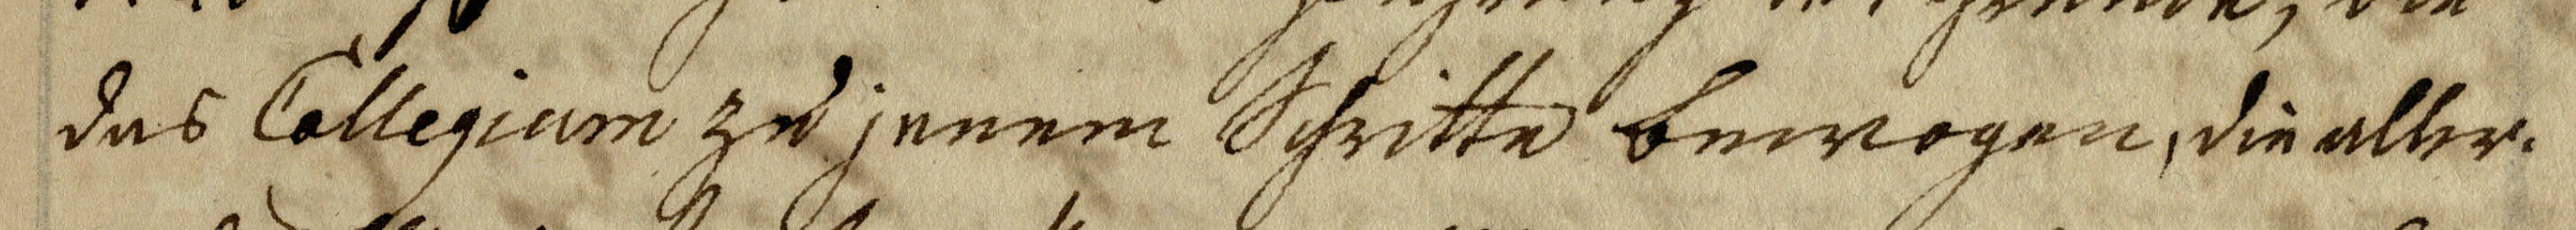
das Collegium zu jenem Schritte bewogen, die aller¬
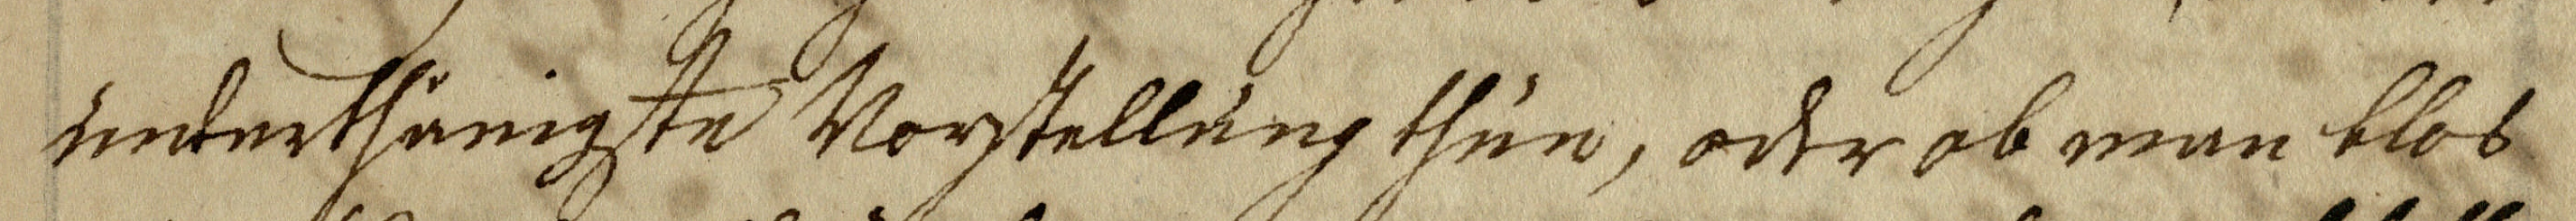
unterthänigste Vorstellung thun, oder ob man blos
